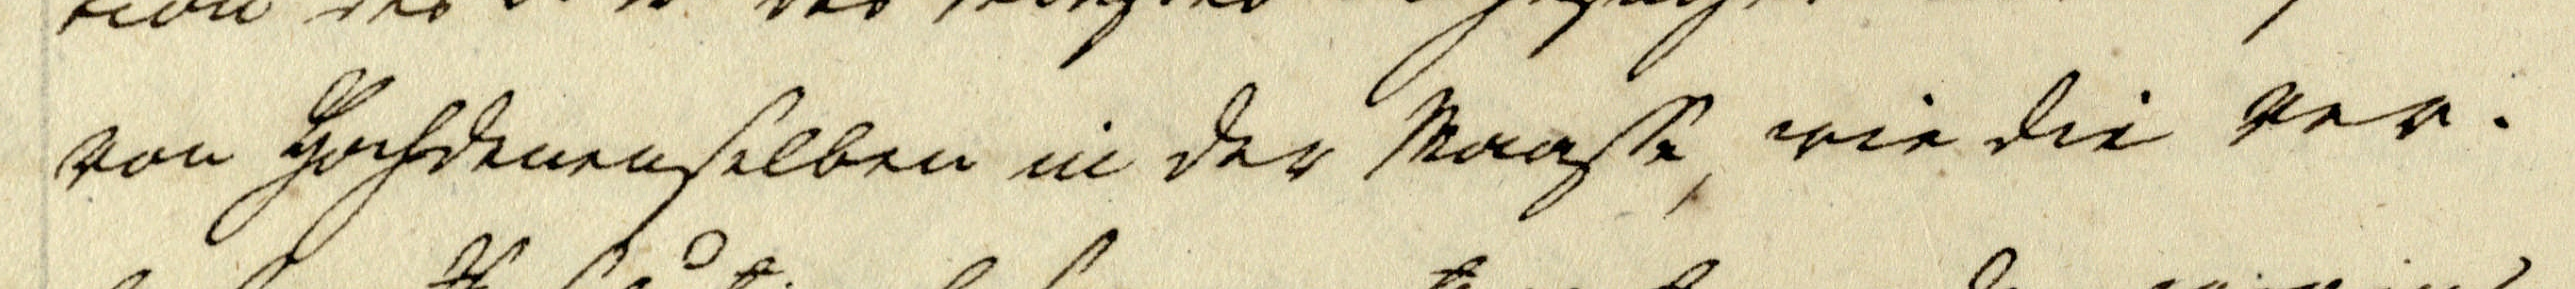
von Hochdenenselben in der Maasse, wie die ver¬
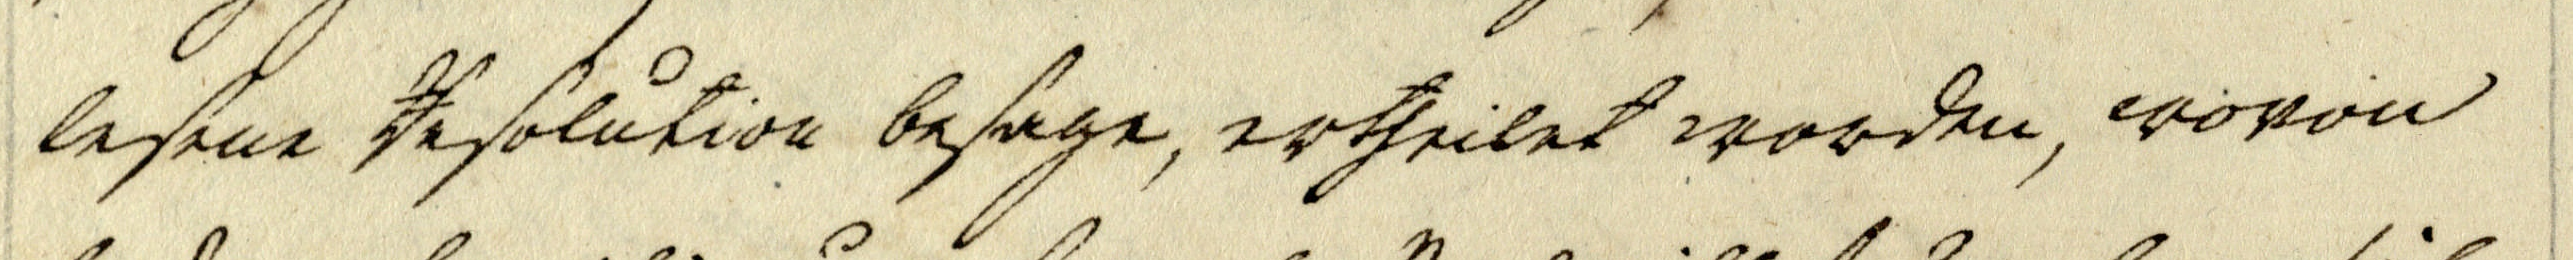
lesene Resolution besage, ertheilet worden, wovon
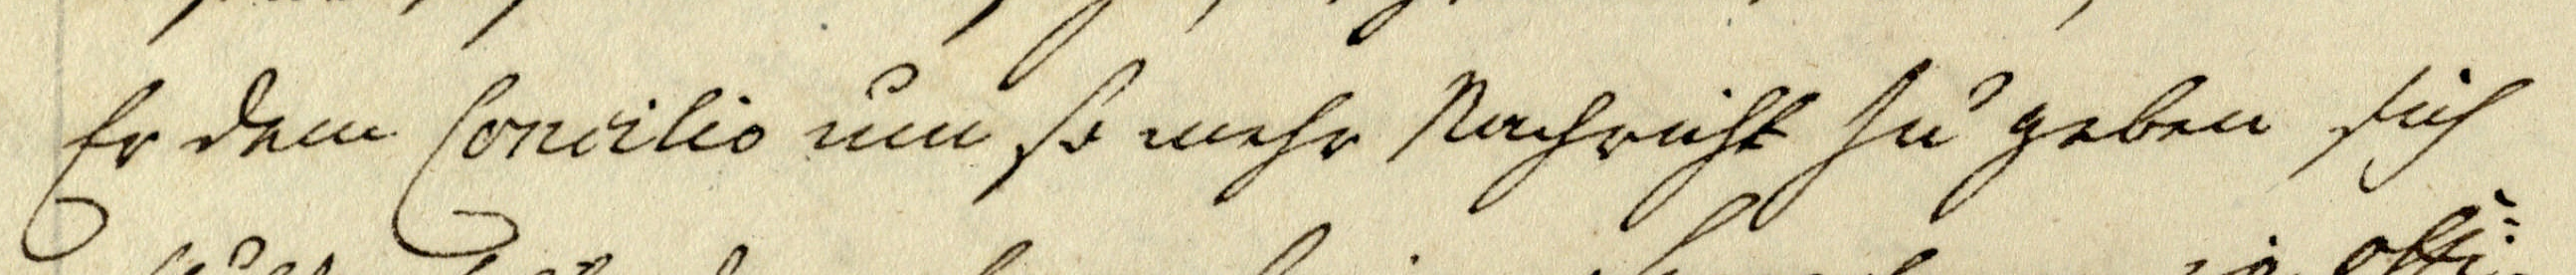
Er dem Concilio um so mehr Nachricht zu geben sich
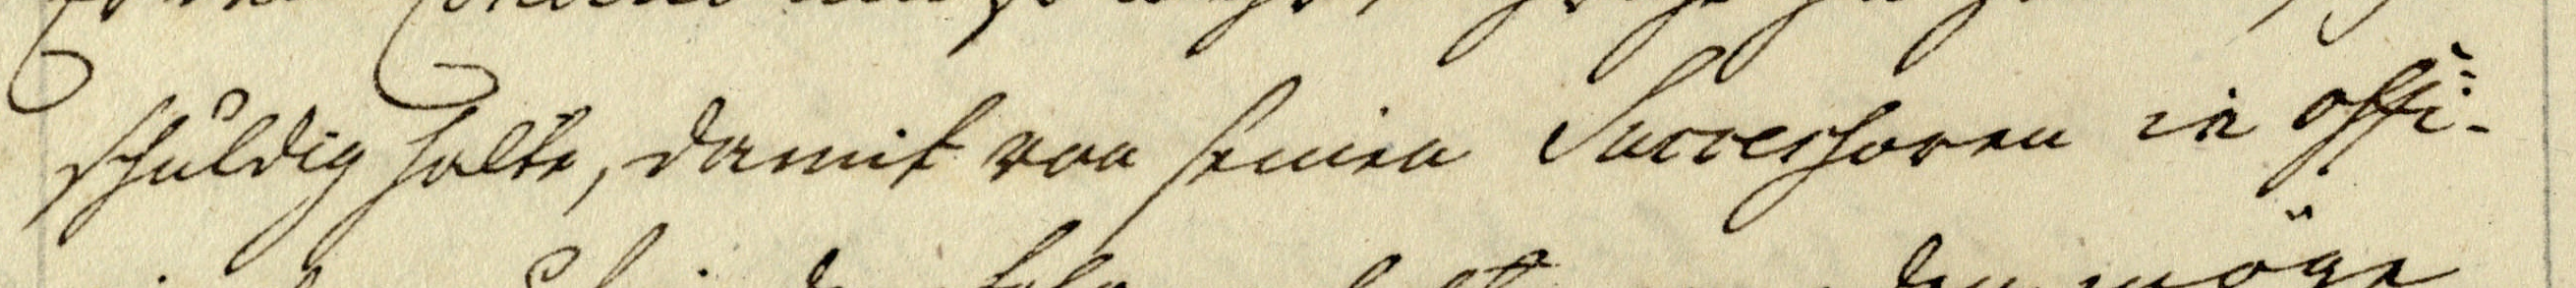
schuldig halte, damit von seinen Successoren in offi¬
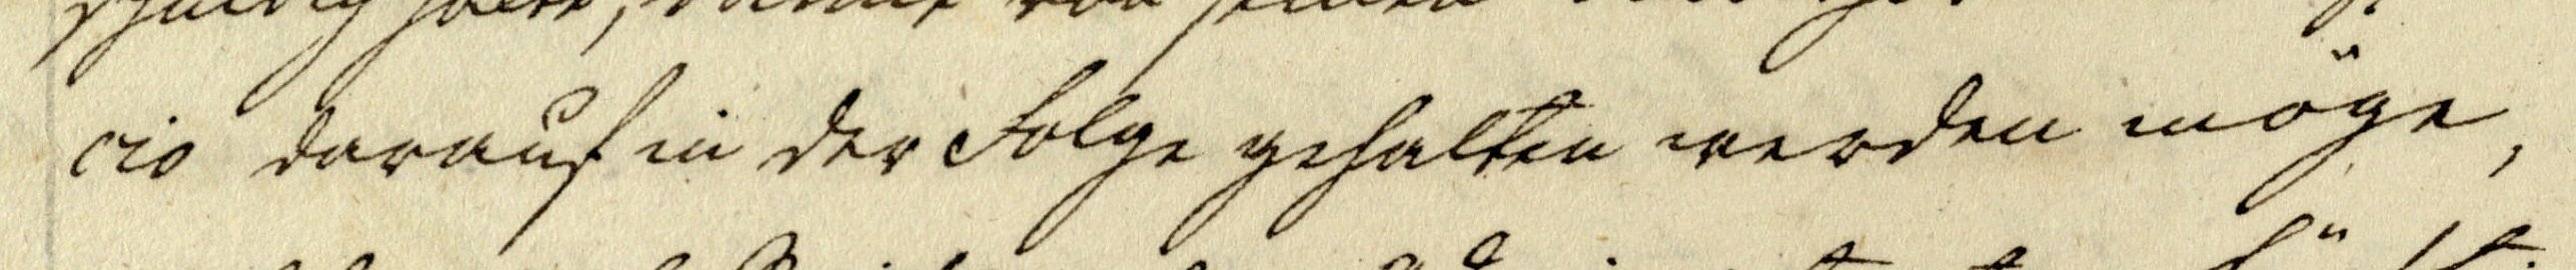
cio darauf in der Folge gehalten werden möge,
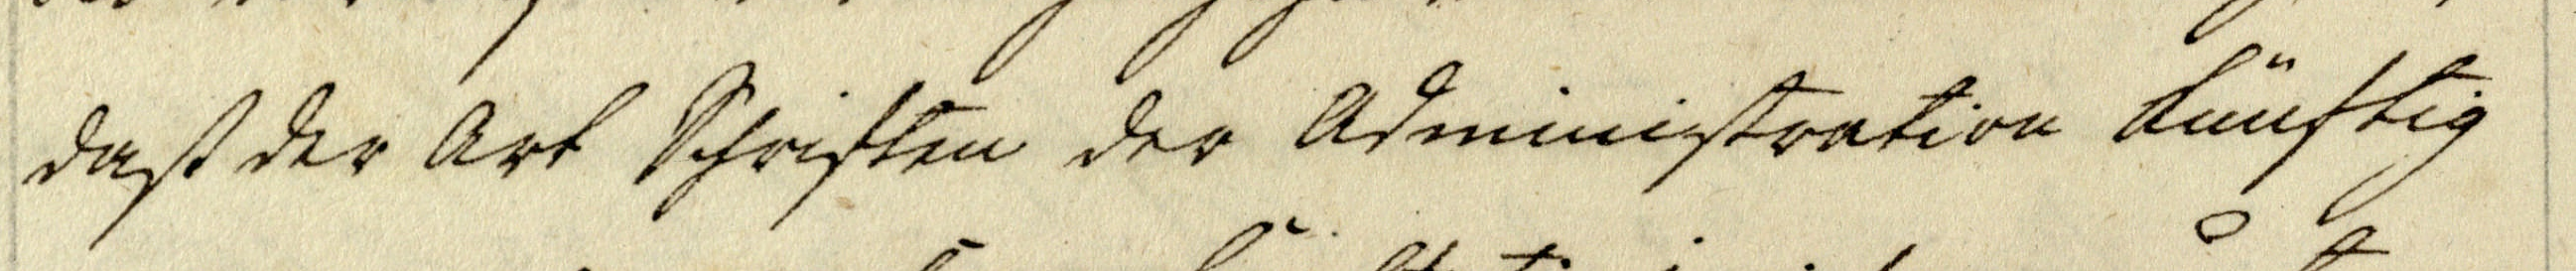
daß der Art Schriften der Administration künftig
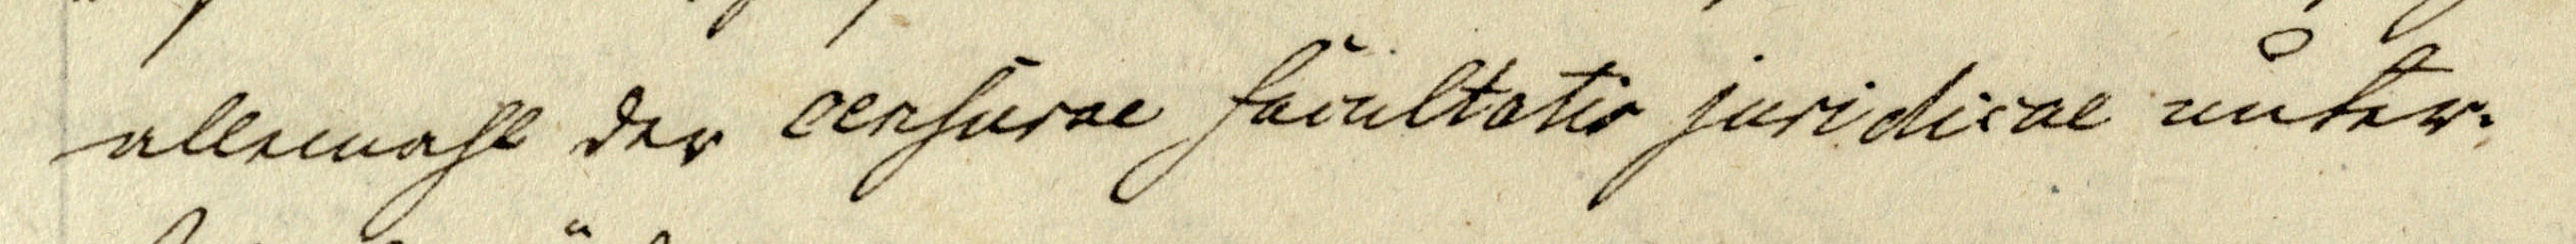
allemahl der censurae facultatis juridicae unter¬
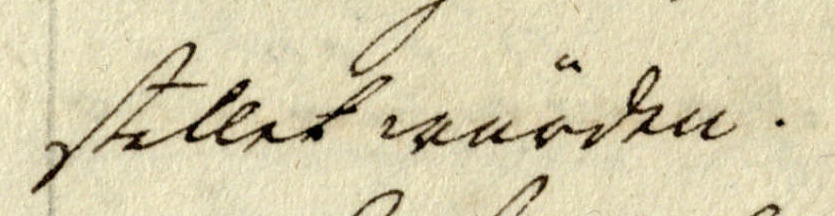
stellet würden.
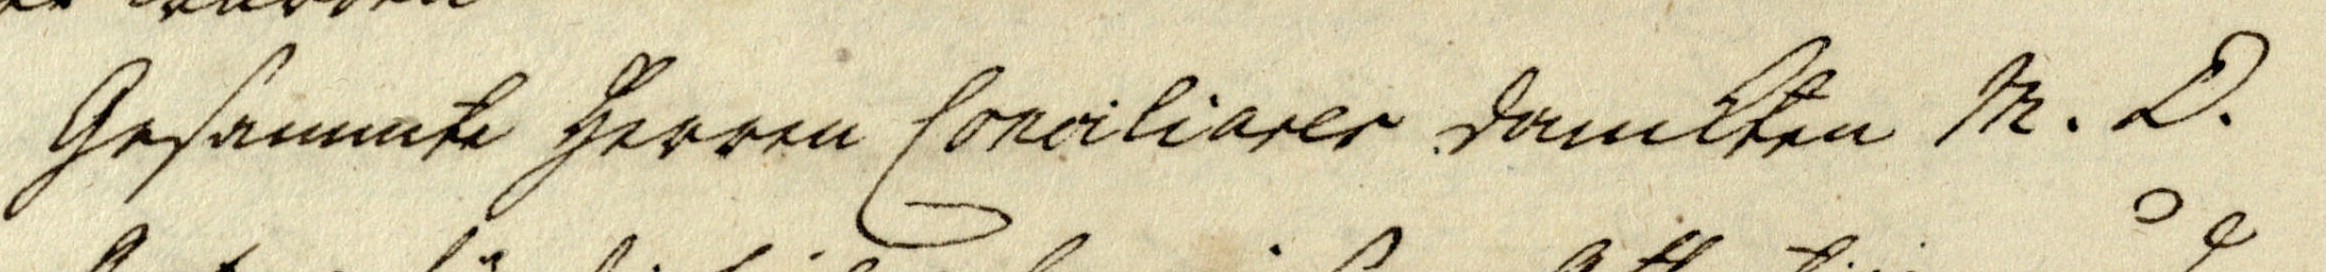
Gesammte Herren Conciliares danckten M. D.
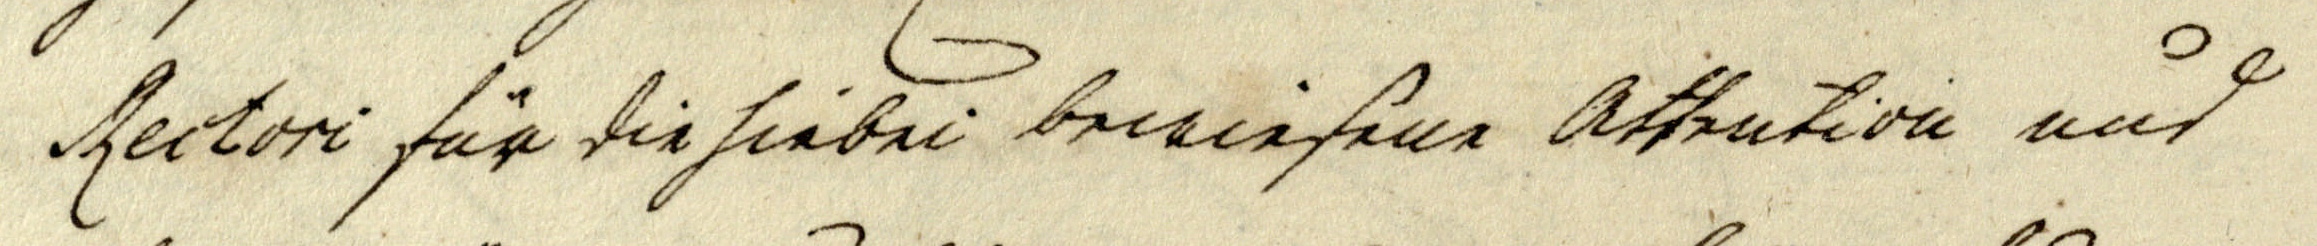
Rectori für die hiebei bewiesene Attention und
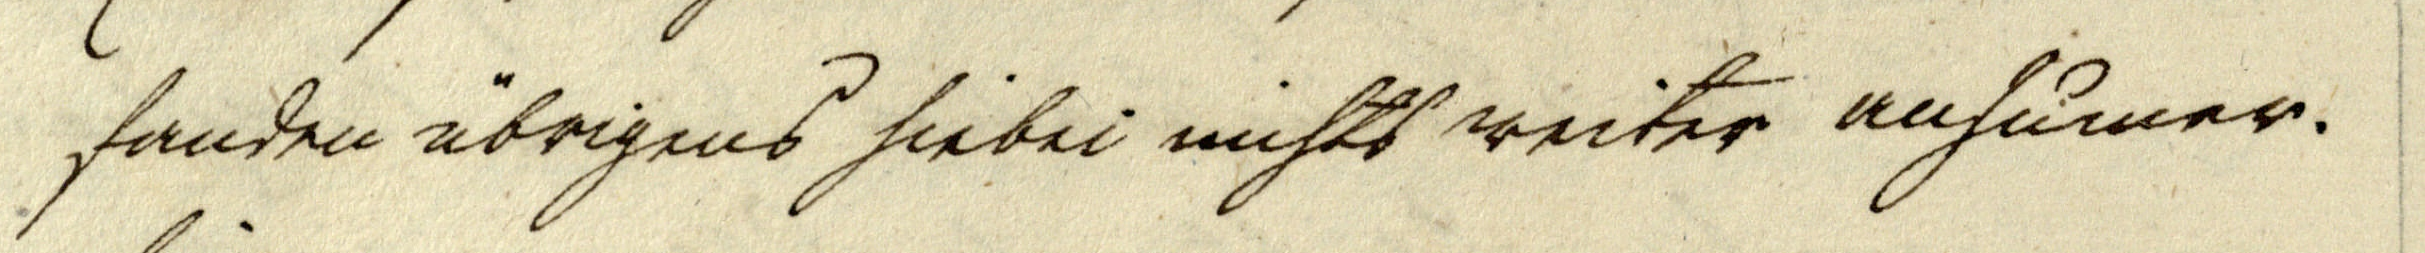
fänden übrigens hiebei nichts weiter anzumer¬
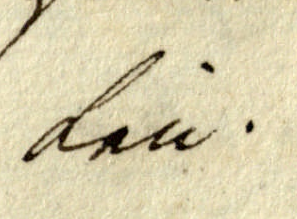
ken.
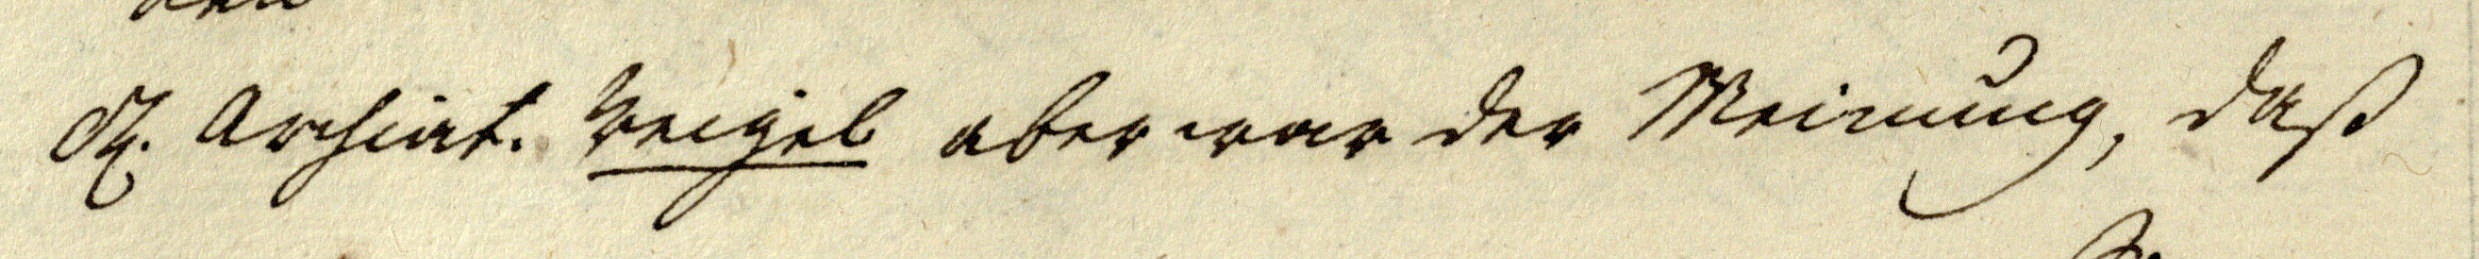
dh. Arhiat. Weigel aber war der Meinung, daß
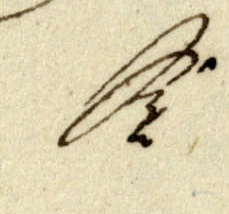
Sr
